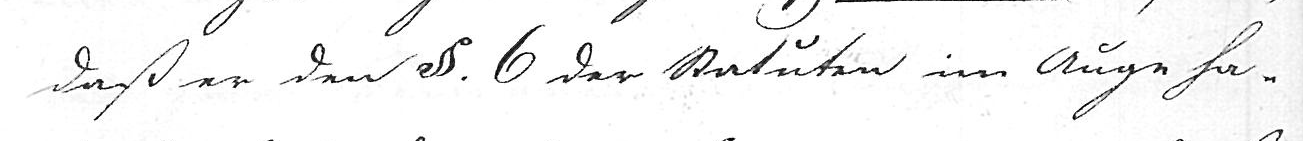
daß er den §. 6 der Statuten im Augen ha-
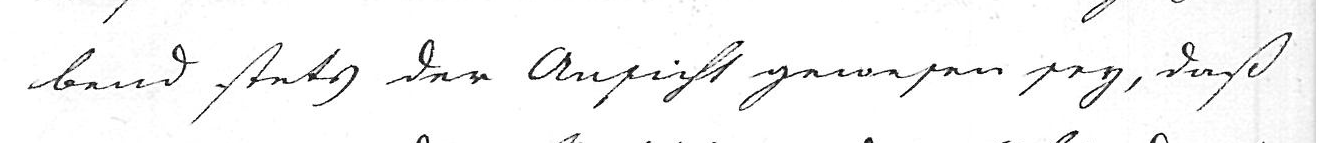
bend stets der Ansicht gewesen sey, daß
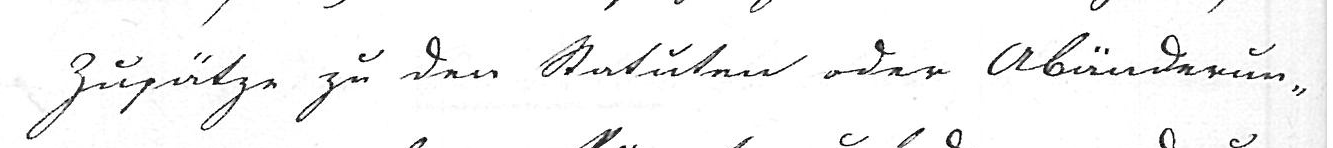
Zusätze zu den Statuten oder Abänderun-
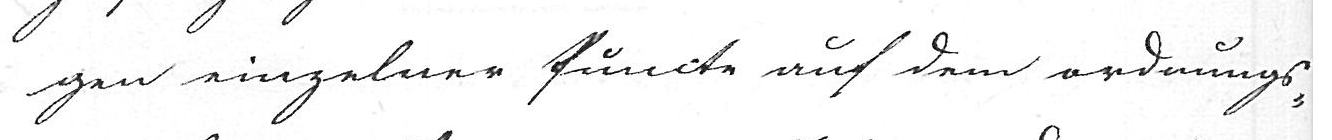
gen einzelner Puncte auf dem ordnungs-
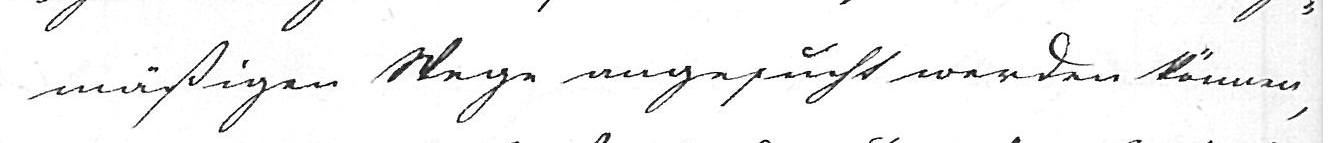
mäßigen Wege angesucht werden können,
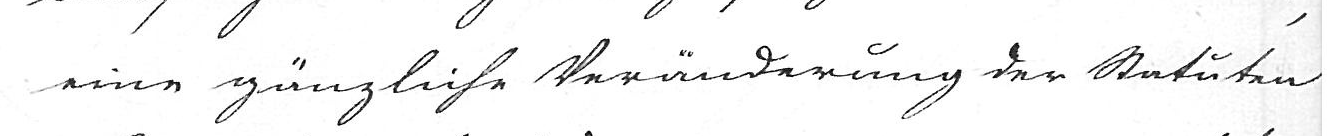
eine gänzliche Veränderung der Statuten
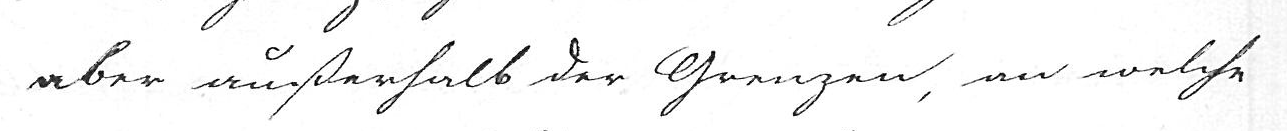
aber außerhalb der Grenzen, an welche
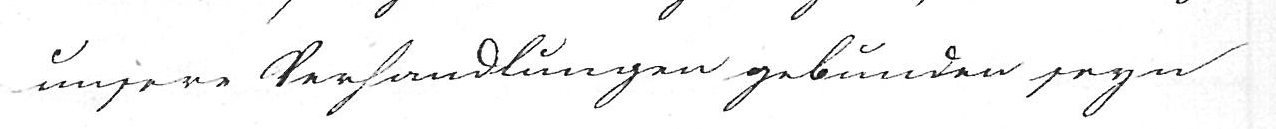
unsere Verhandlungen gebunden seyn
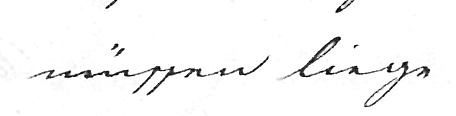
müssen liege.
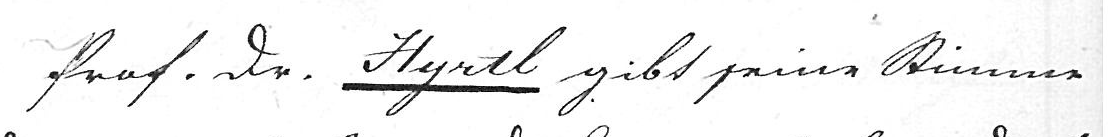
Prof. Dr. Hyrtl gibt seine Stimme
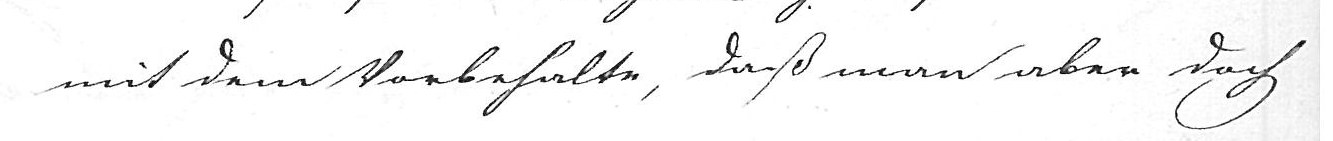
mit dem Vorbehalte, daß man aber doch
